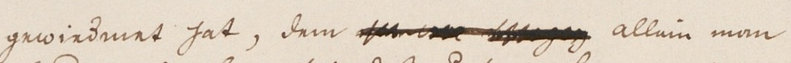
gewiedmet hat, dem ...allein man
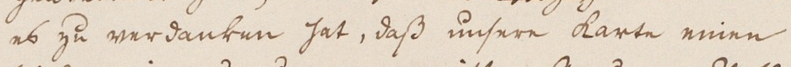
es zu verdanken hat, daß unsere Karte einen
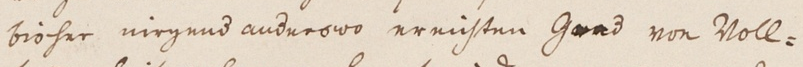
bisher nirgend anderswo erreichten Grad von Voll-
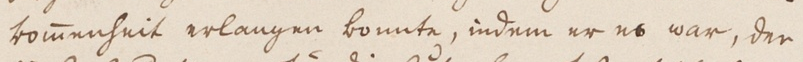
kommenheit erlangen konnte, indem er es war, der
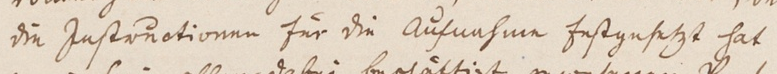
die Instructionen für die Aufnahme festgesetzt hat
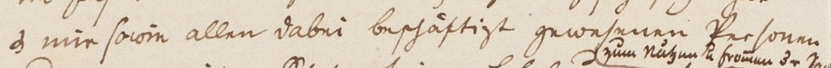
& mir sowie allen dabei beschäftigt gewesenen Personen
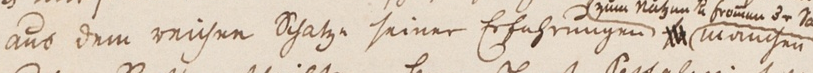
aus dem reichen Schatze seiner Erfahrungenzum Nutzen u Frommen
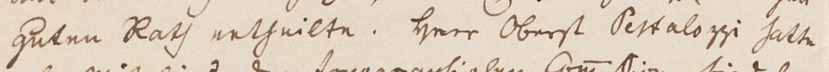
guten Rath ertheilte. Herr Oberst Pestalozzi hatte
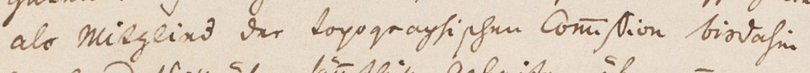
als Mitglied der topographischen Commission bisdahin
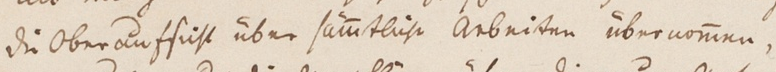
die Oberaufsicht über sämmtliche Arbeiten übernommen,
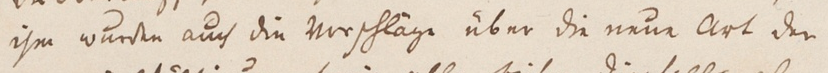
ihm wurden auch die Vorschläge über die neue Art der
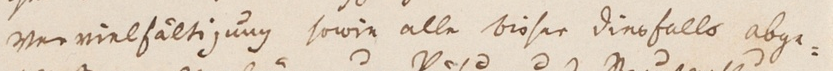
Vervielfältigung sowie alle bisher diesfalls abge-
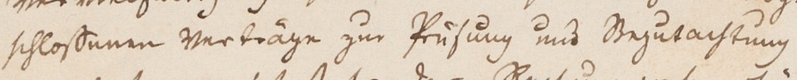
schloßenen Verträge zur Prüfung und Begutachtung
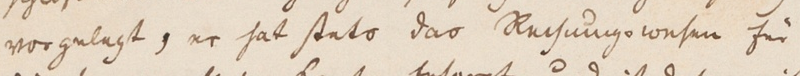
vorgelegt, er hat stets das Rechnungswesen für
